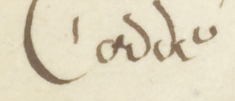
Coddé
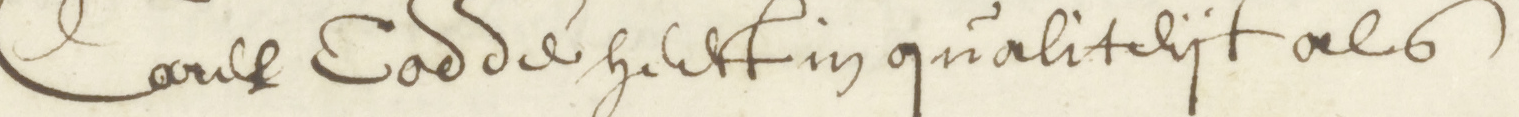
Carel Coddé heeft in qualiteijt als
